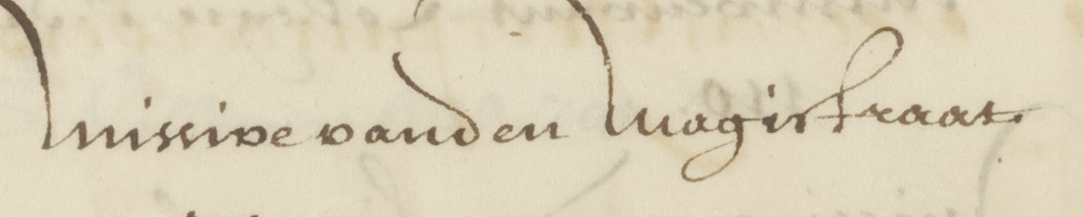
missive vanden magistraat
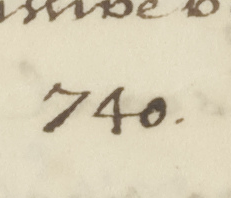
740.
